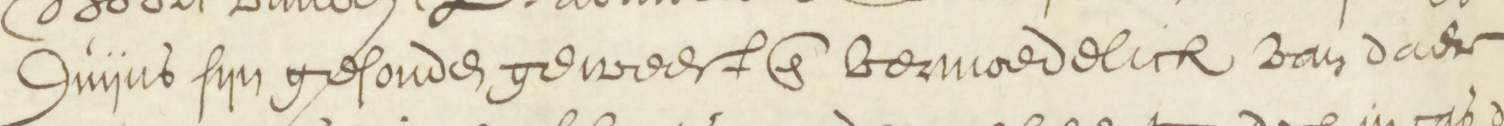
Duijns syn gesonden geweest & vermoedelick van daer
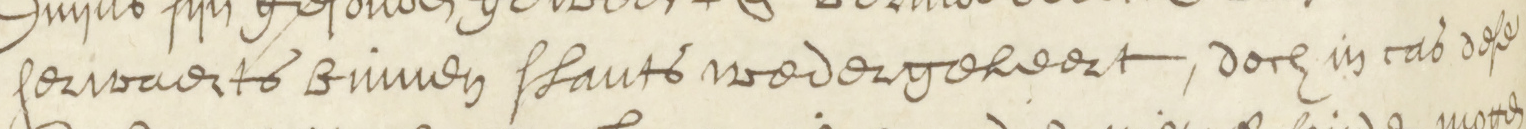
herwaerts binnen sLants wedergekeert, doch in cas dese
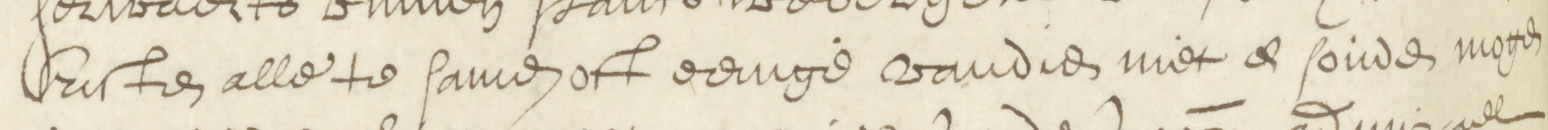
kisten alle te samen off eenige vandien niet en souden mogen
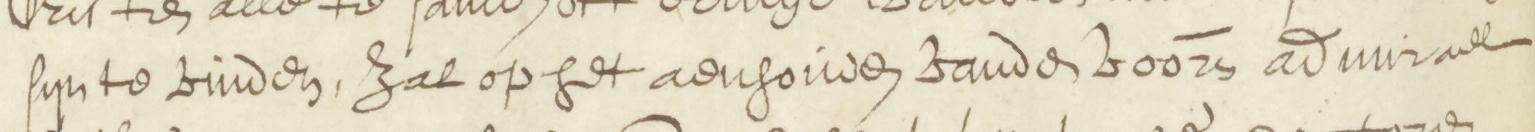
syn te vinden, zal op het aenhouden vanden voorn admirael
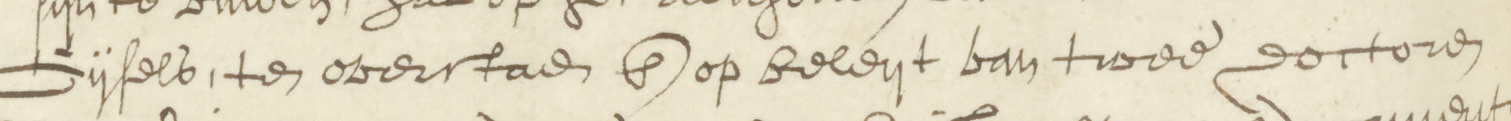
Gijsels, ten overstaen & op beleyt van twee doctoren
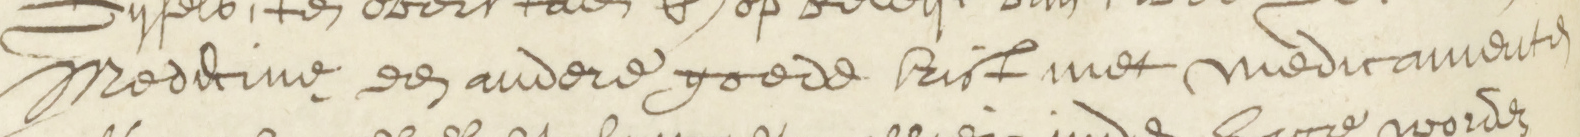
Medecine, een andere goede kist met medicamenten
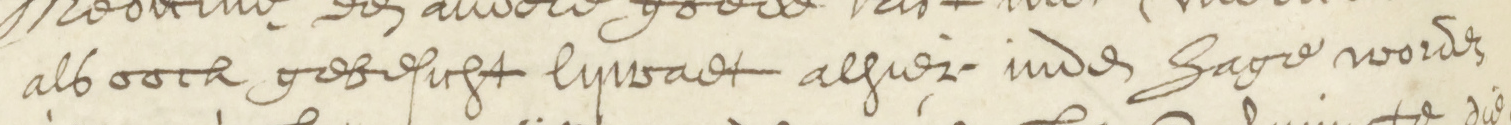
als oock gebesicht lywaet alhier inden Hage worden
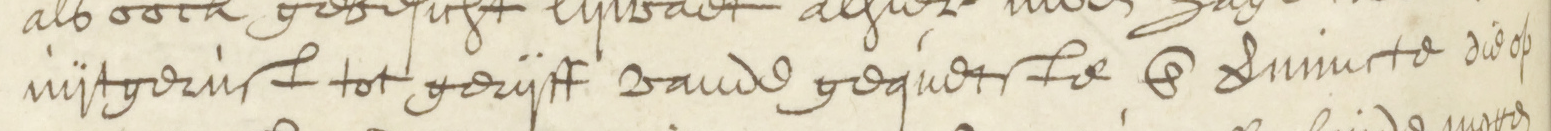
uijtgerust tot gerijff vande gequetste & vmincte die op
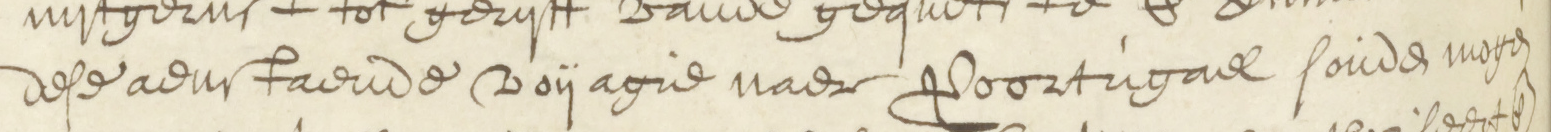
dese aenstaende voijagie naer Poortugael souden mogen
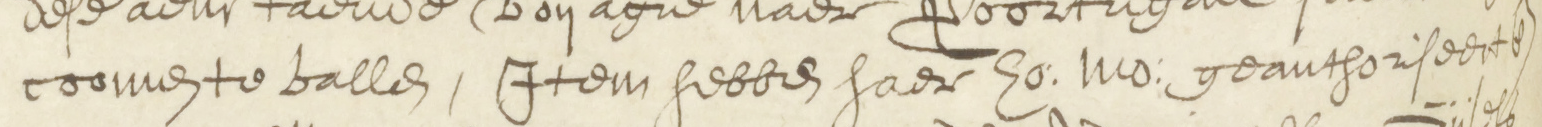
coomen te vallen. Item hebben haer ho:mo: geauthoriseert &
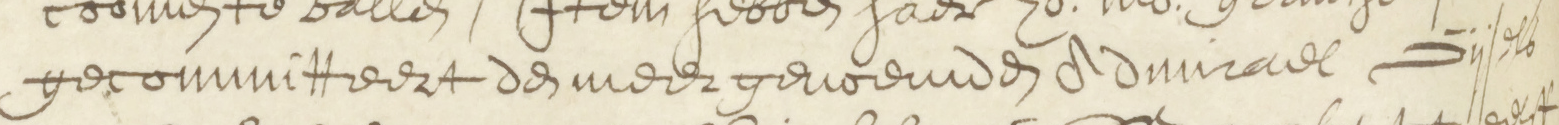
gecommitteert den meergenoemden Admirael Gijsels
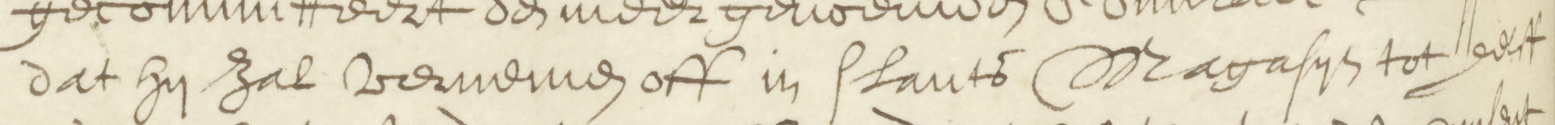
dat hy zal vernemen off in sLants Magasyn tot delf
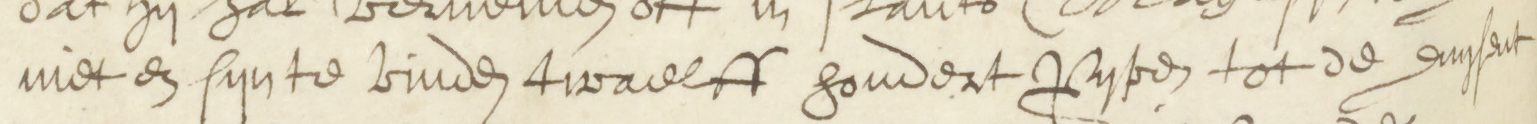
niet en syn te vinden twaelff hondert Pypen tot de duysent
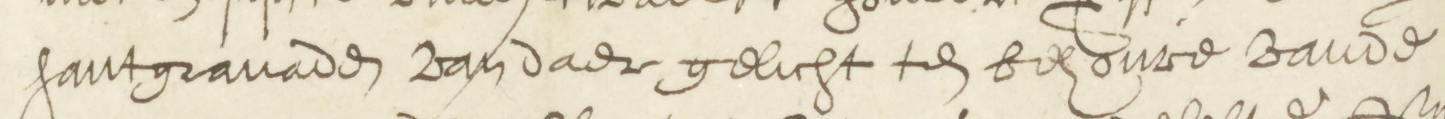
hantgranaden van daer gelicht ten behouve vande
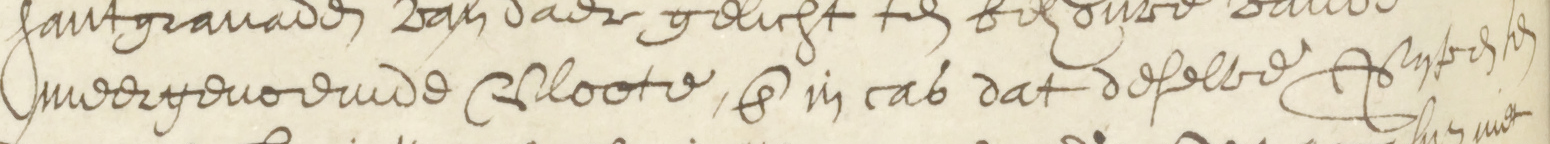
meergenoemde Vloote, & in cas dat deselve Pypen ten
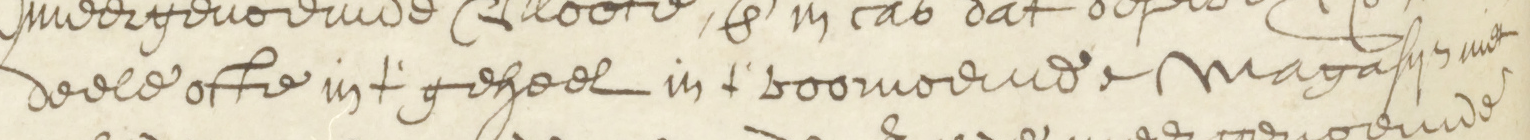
deele ofte in t‛geheel in t‛voornoemde Magasyn niet
